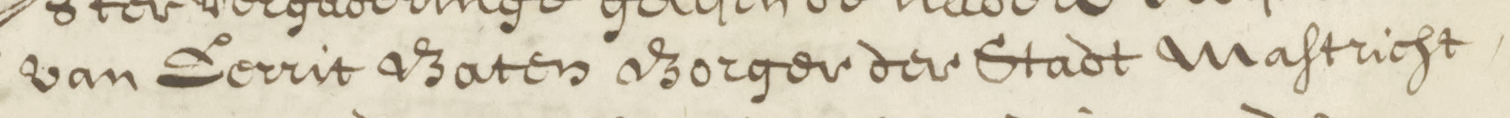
van Gerrit Baten Borger der Stadt Mastricht
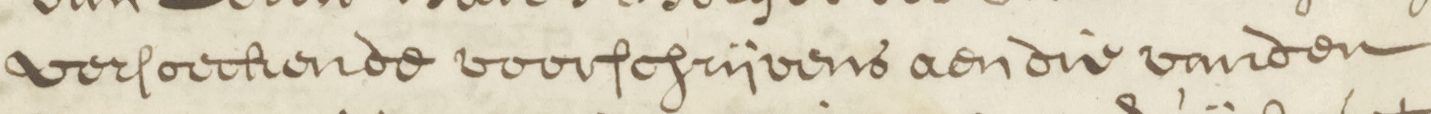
versoeckende voorschrijvens aen die vanden
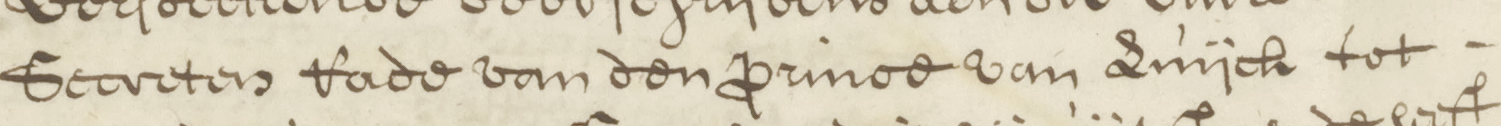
Secreten Rade van den prince van Luijck tot ¬
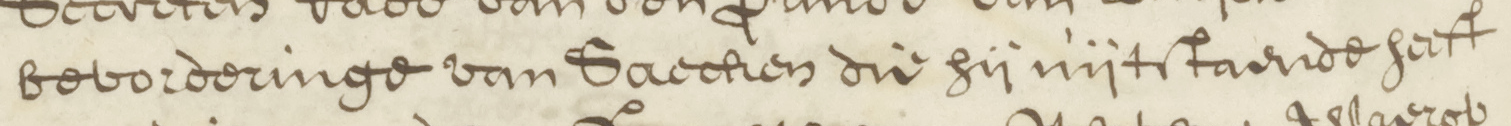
bevorderinge van Saecken die hij uijtstaende heeft
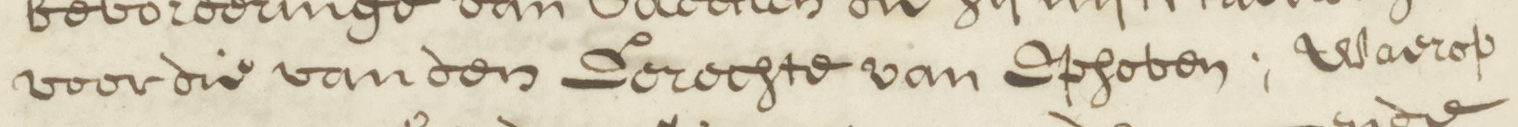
voor die van den Gerechte van Ophoven; Waerop
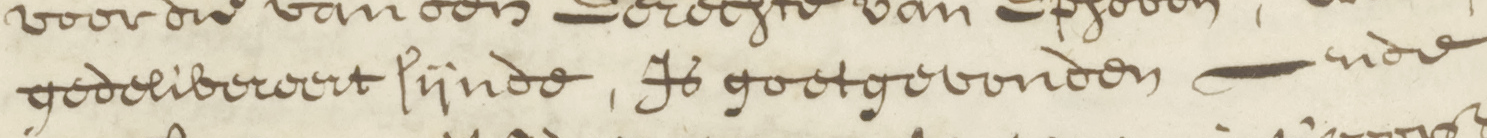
gedelibereert sijnde, Is goetgevonden ende
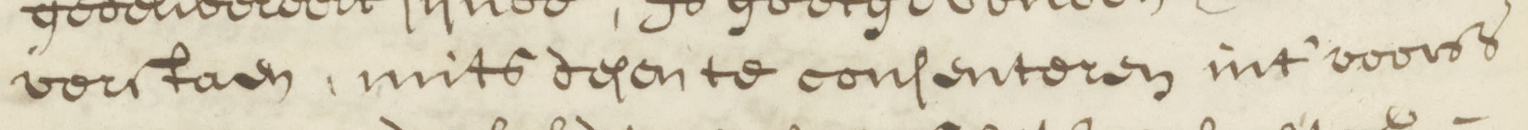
verstaen, mits desen te consenteren int' voors
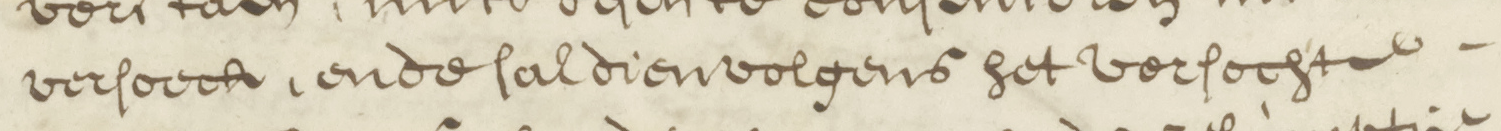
versoeck, ende sal dienvolgens het versochte ¬
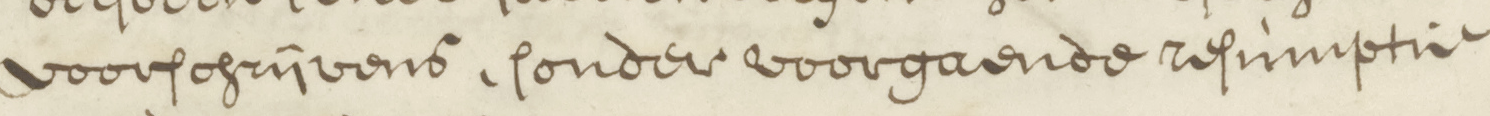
voorschrijvens, sonder voorgaende resumptie
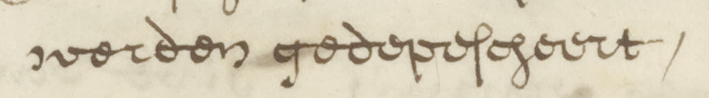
werden gedepescheert.
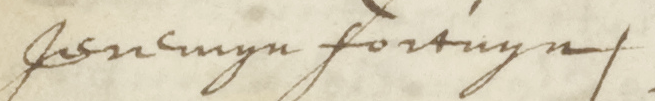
Jeremyn Fortuyn
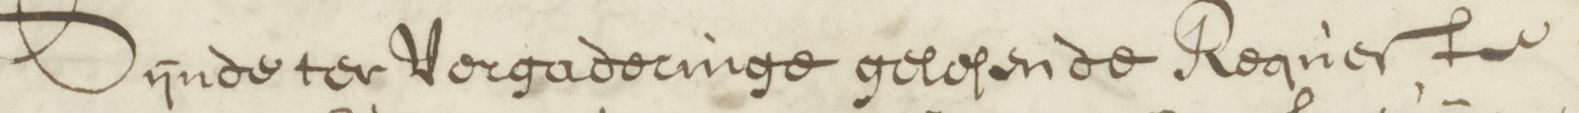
Sijnde ter Vergaderinge gelesen de Requeste
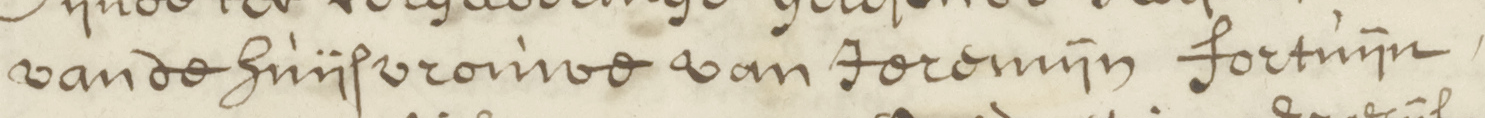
van de huijsvrouwe van Jeremijn Fortuijn,
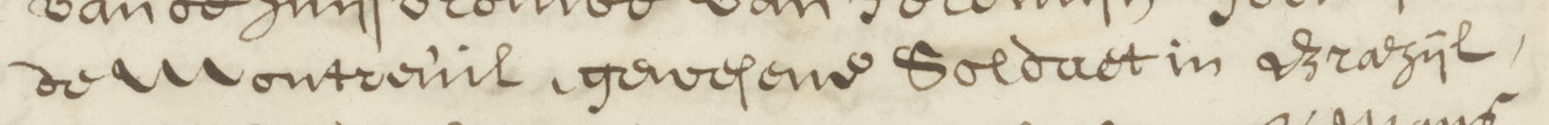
de Montreuil, gewesene Soldaet in Brazijl,
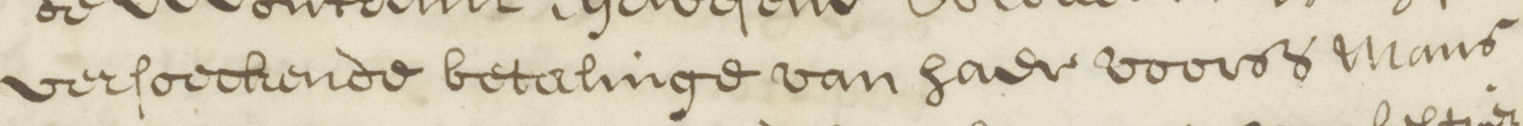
versoeckende betalinge van haer voors Mans
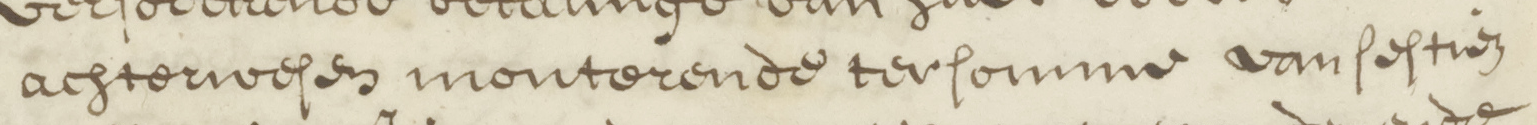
achterwesen monterende ter somme van sestien
